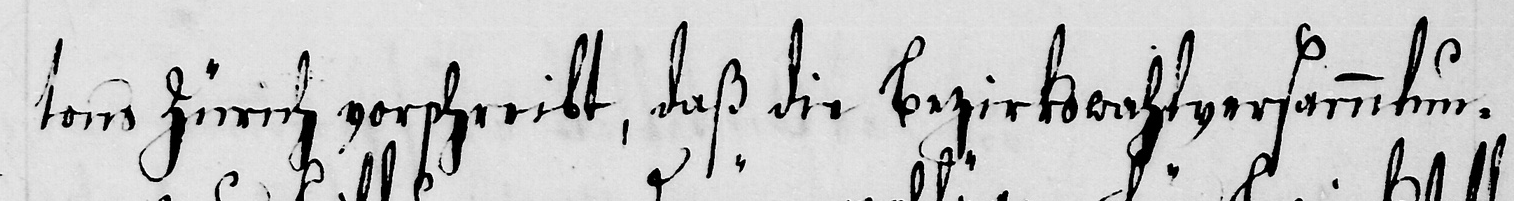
tons Zürich vorschreibt, daß die Bezirkswahlversammlun¬
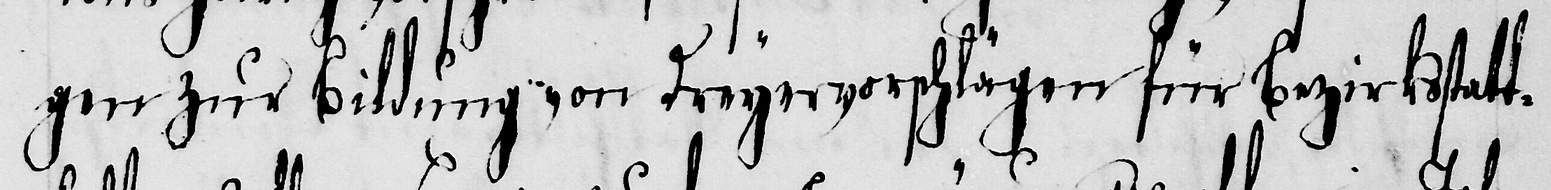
gen zur Bildung von Dreyervorschlägen für Bezirksstat¬
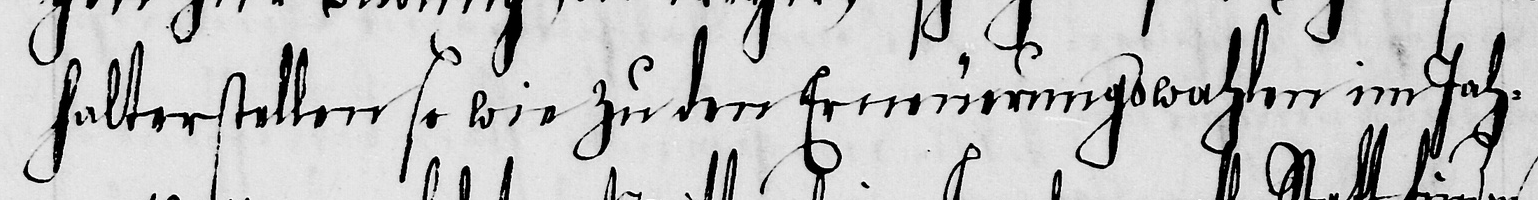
thalterstellen so wie zu den Erneuerungswahlen im Jah¬
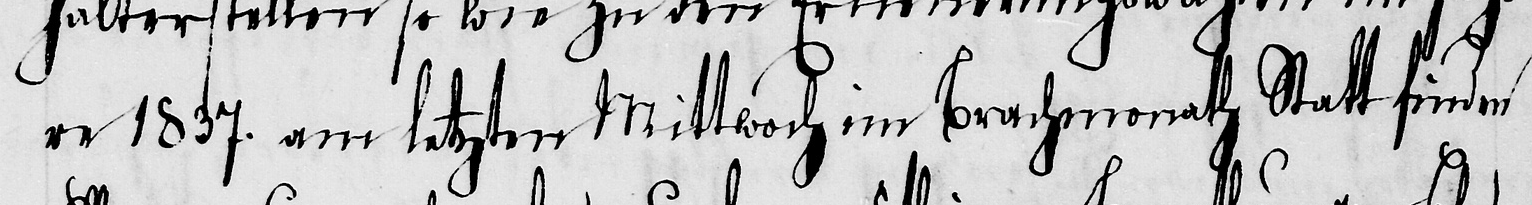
re 1837. am letzten Mittwoch im Brachmonath Statt finden
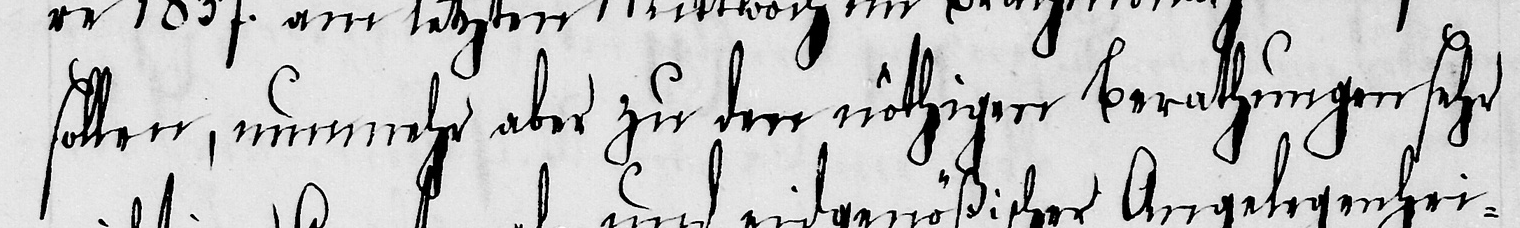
sollen, nunmehr aber zu den nöthigen Berathungen sehr
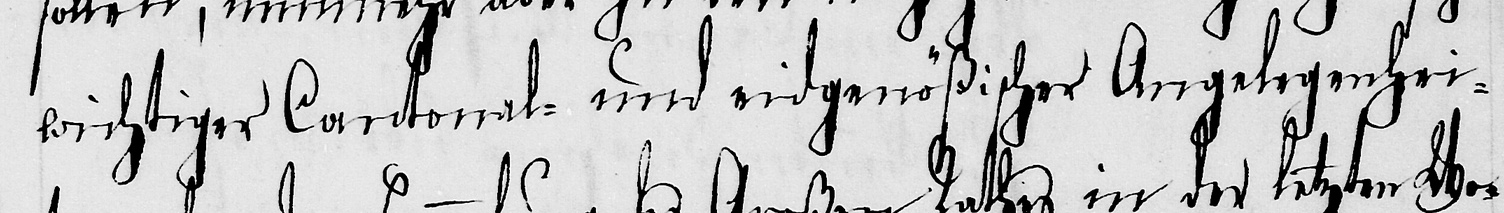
wichtiger Cantonal- und eidgenößischer Angelegenhei¬
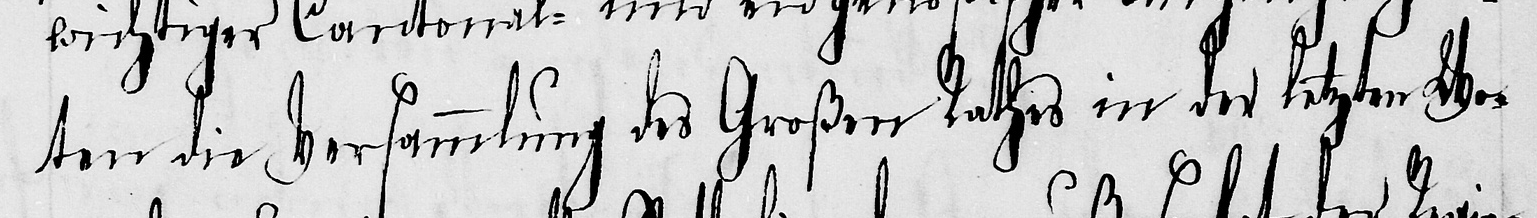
ten die Versammlung des Großen Rathes in der letzten Wo¬
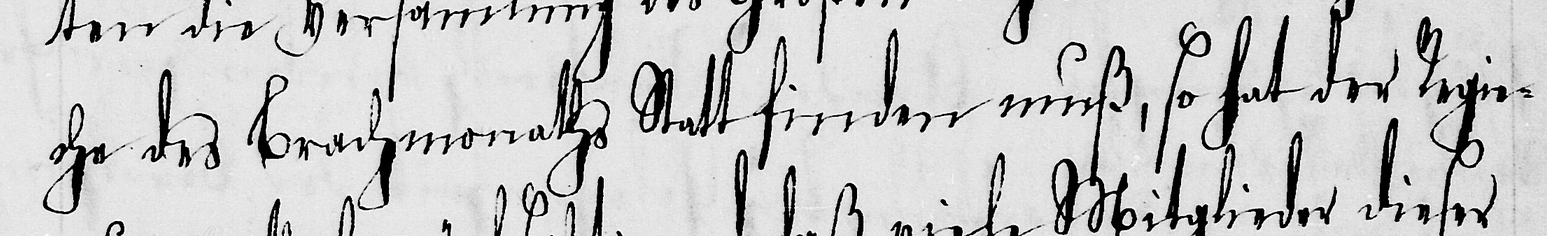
che des Brachmonaths Statt finden muß, so hat der Regie¬
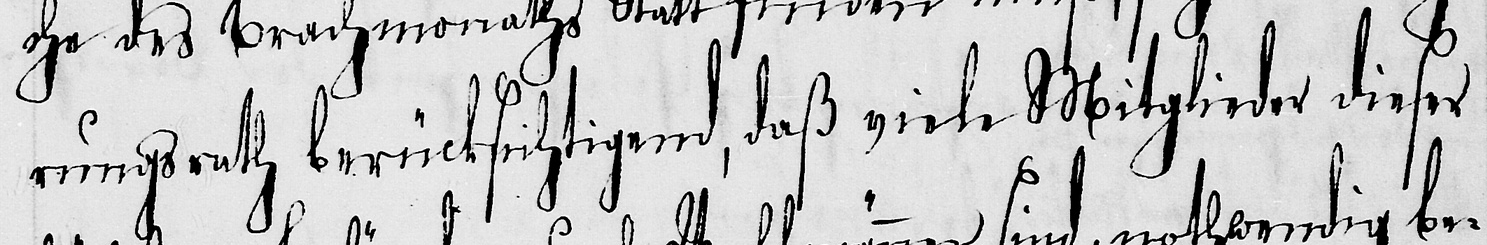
rungsrath berücksichtigend, daß viele Mitglieder dieser
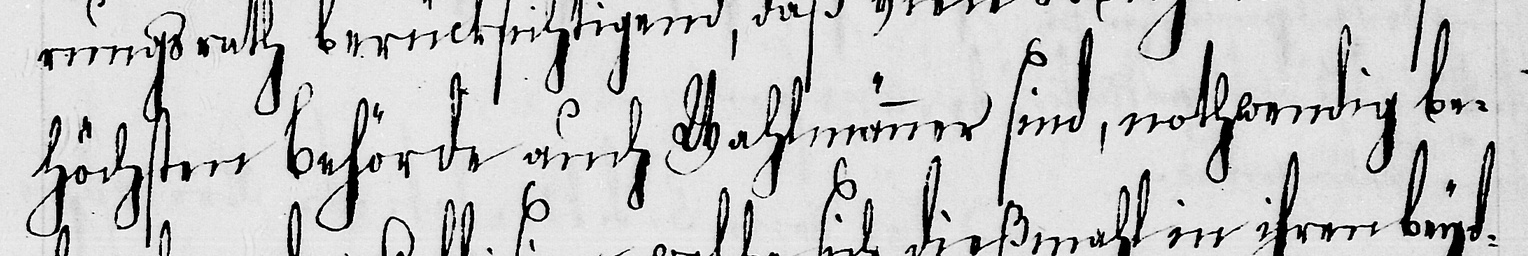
höchsten Behörde auch Wahlmänner sind, nothwendig be¬
